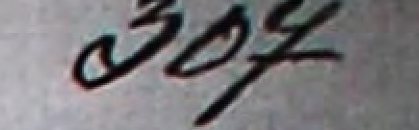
307
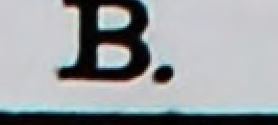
B.
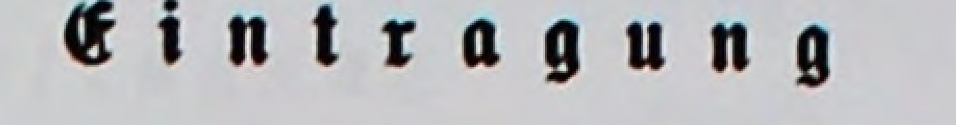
Eintragung
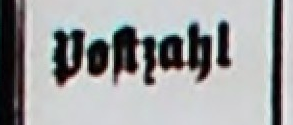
Postzahl
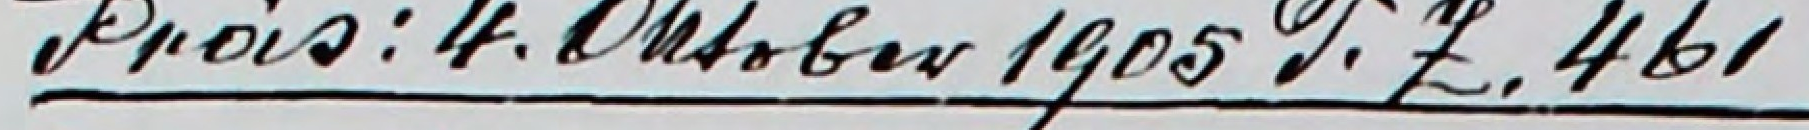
Präs: 4. Oktober 1905 T.Z. 461
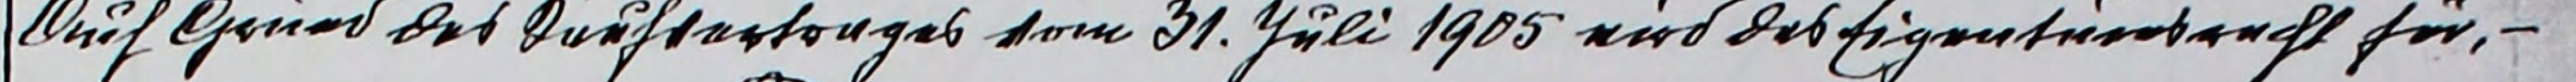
Auf Grund des Kaufvertrages vom 31. Juli 1905 wird das Eigentumsrecht für,-
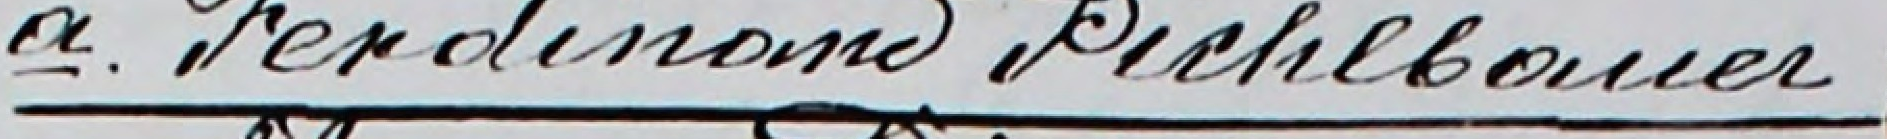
a. Ferdinand Pichlbauer
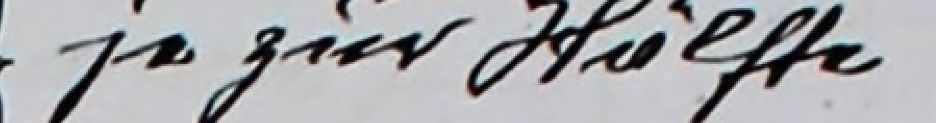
je zur Hälfte
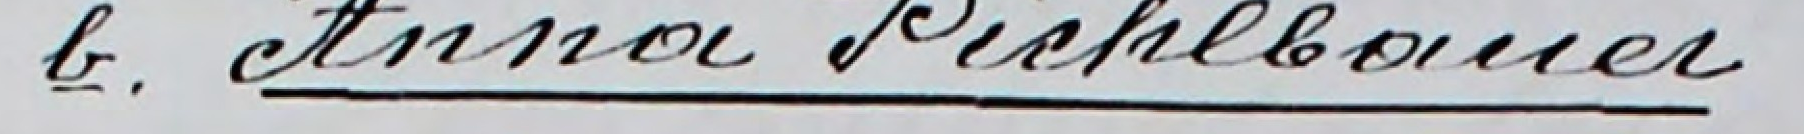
b. Anna Pichlbauer
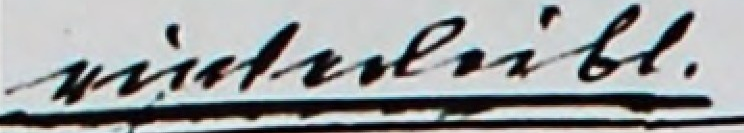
einverleibt.
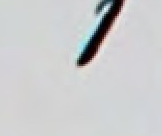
1
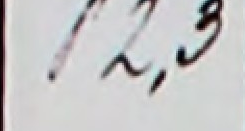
s 2, 3
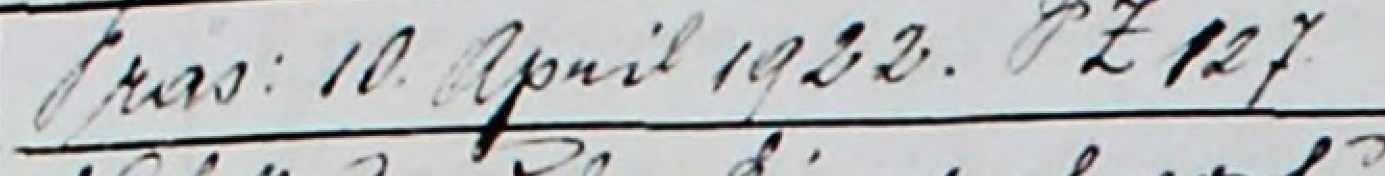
Präs: 10. April 1922. T Z 127.
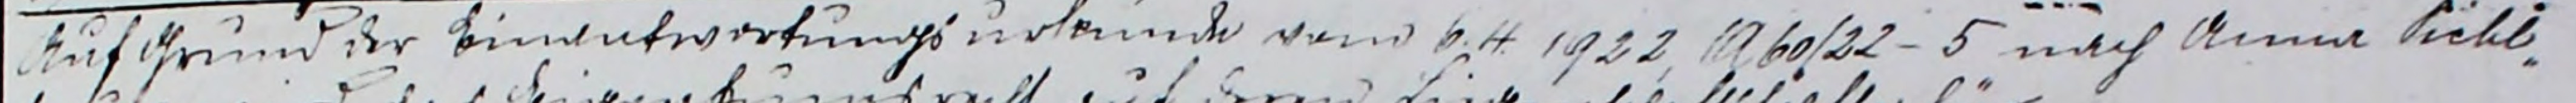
Auf Grund der Einantwortungsurkunde vom 6.4.1922, A 60/22 - 5 nach Anna Pichl„
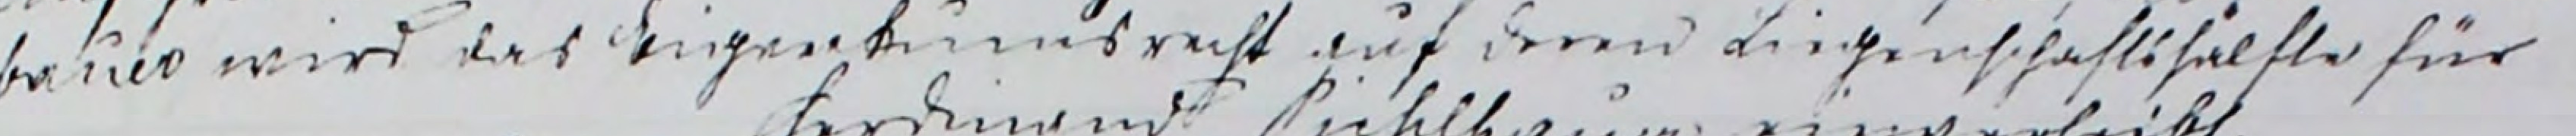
bauer wird das Eigentumsrecht auf deren Liegenschaftshälfte für
